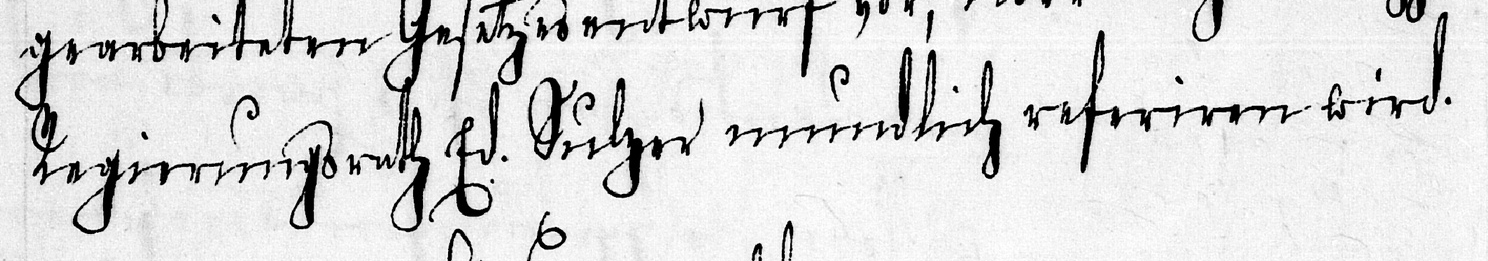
Regierungsrath Ed. Sulzer mundlich referiren wird.
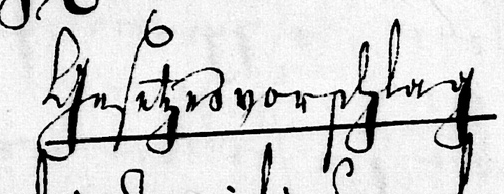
Gesetzesvorschlag
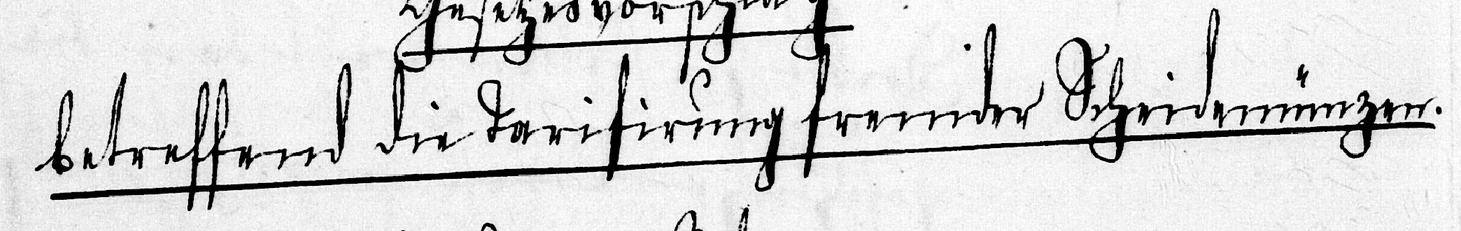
betreffend die Tarifirung fremder Scheidemünzen.
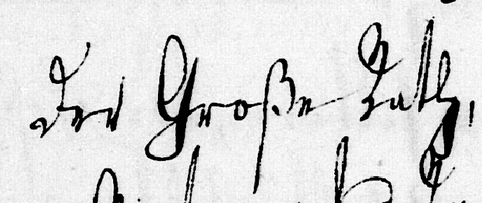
Der Große Rath,
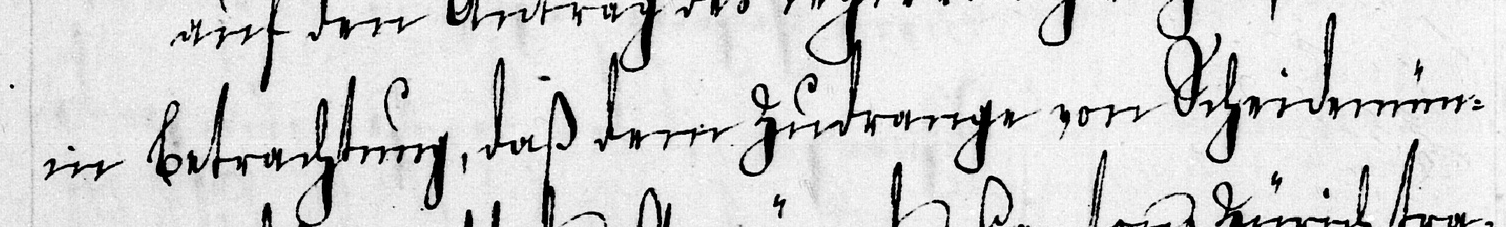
in Betrachtung daß dem Zudrange von Scheidemün¬
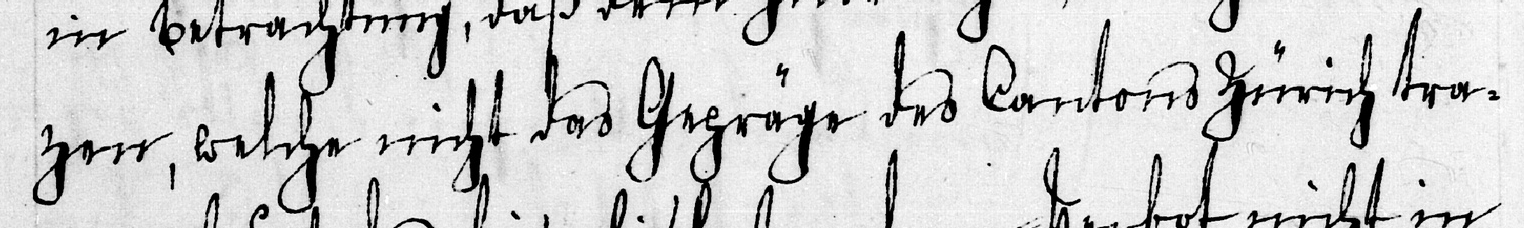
zen, welche nicht das Gepräge des Cantons Zürich tra¬
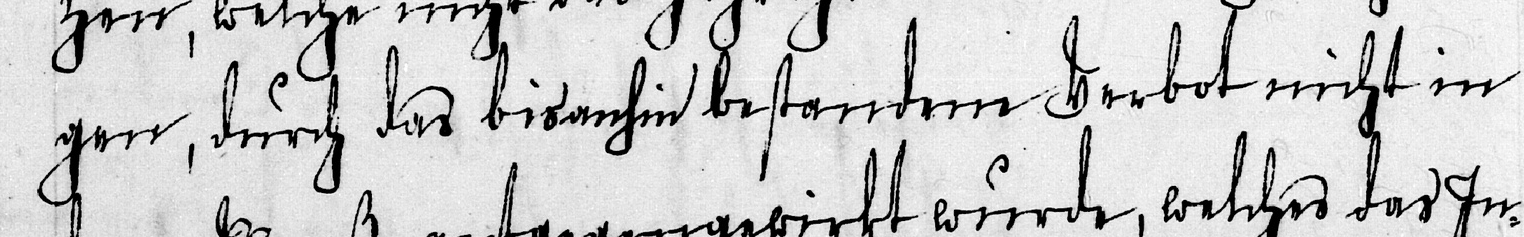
gen, durch das bis anhin bestandene Verbot nicht in
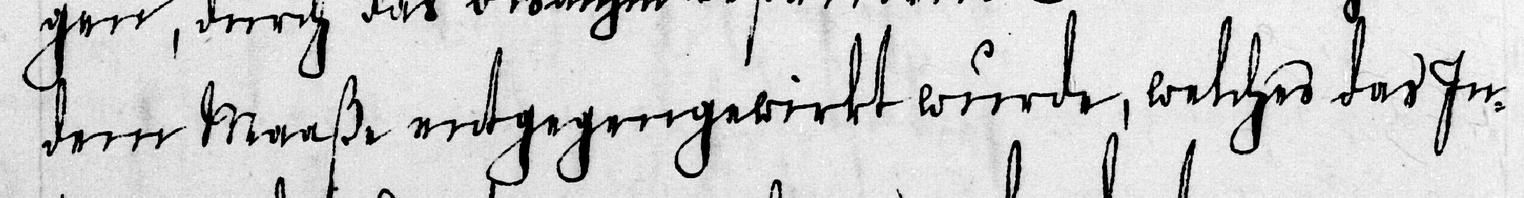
dem Maaße entgegengewirkt wurde, welches das In¬
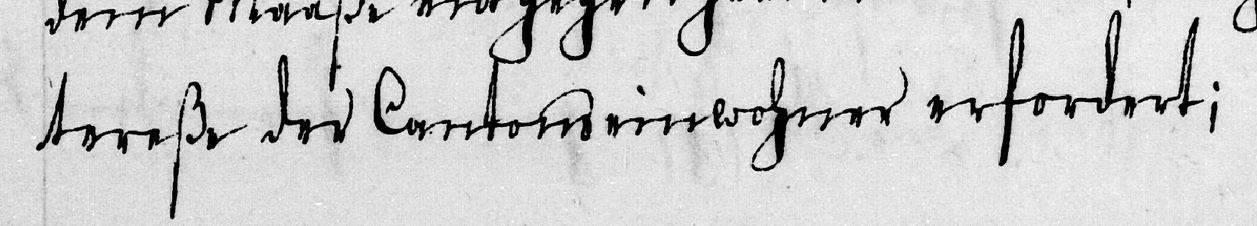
tereße der Cantonseinwohner erfordert;
